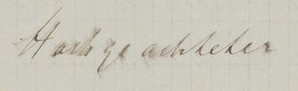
Hochgeachteter
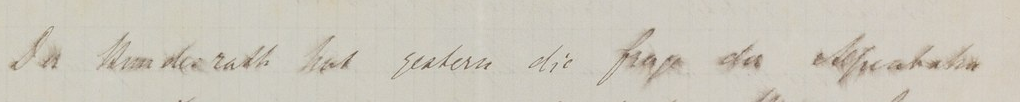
Der Bundesrath hat gestern die Frage der Alpenbahn
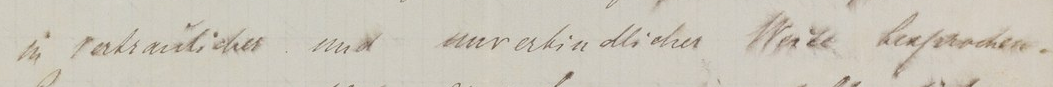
in vertraulicher und unverbindlicher Weise besprochen.
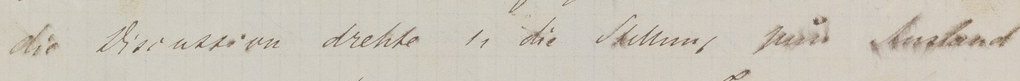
die Discussion drehte 1) die Stellung zum Ausland
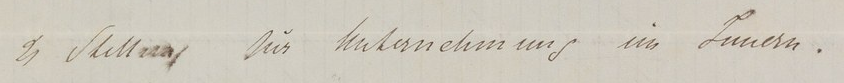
2) Stellung zur Unternehmung im Innern.
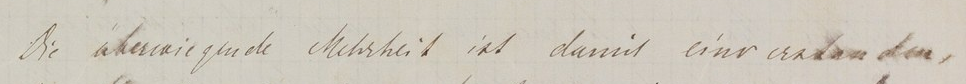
Die überwiegende Mehrheit ist damit einverstanden,
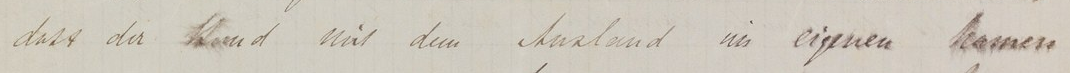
dass der Bund mit dem Ausland im eigenen Namen
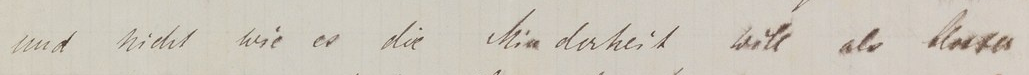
und nicht wie es die Minderheit will als blosser
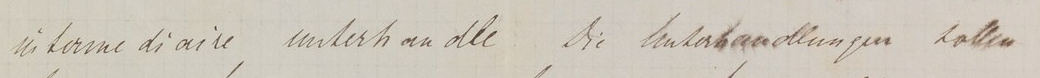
intermediaire unterhandle. Die Unterhandlungen sollen
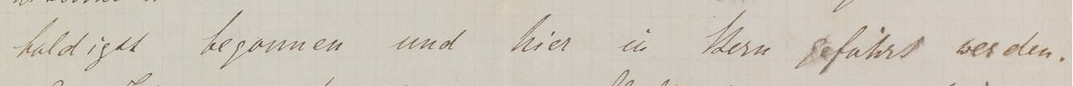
baldigst begonnen und hier in Bern geführt werden.
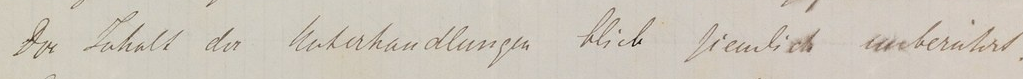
Der Inhalt der Unterhandlungen blieb ziemlich unberührt.
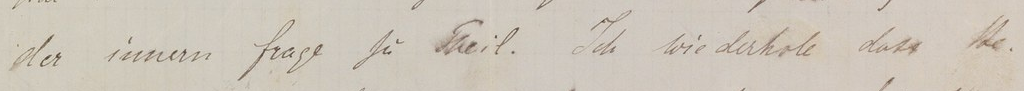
der innern Frage zu Theil. Ich wiederhole dass Be-
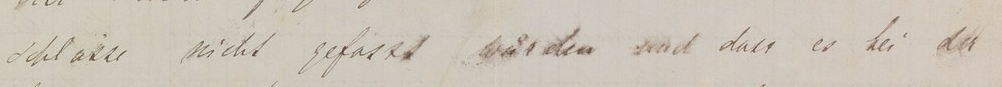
schlüsse nicht gefasst wurden und dass es bei der
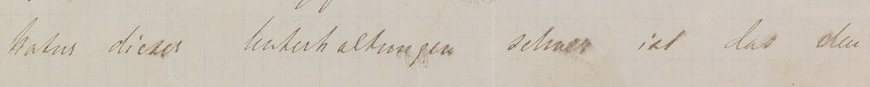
Natur dieser Unterhaltungen schwer ist das den
